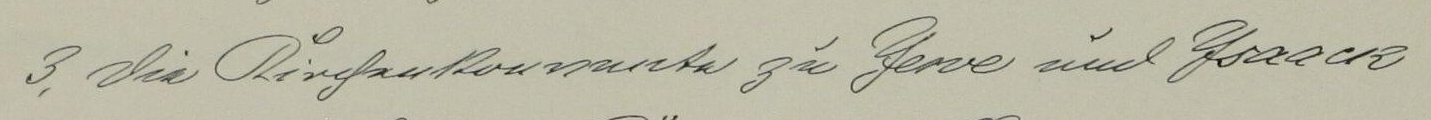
3. Die Kirchenkonvente zu Jewe und Isaack
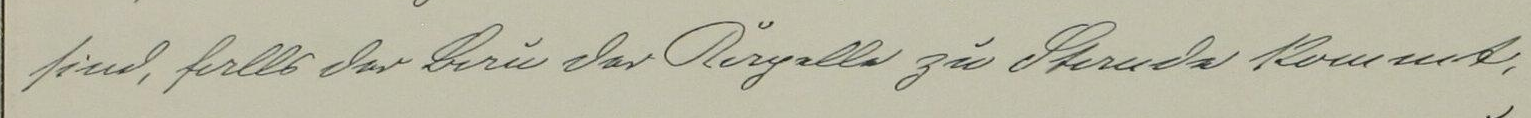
sind, falls der Bau der Kapelle zu Stande kommt,
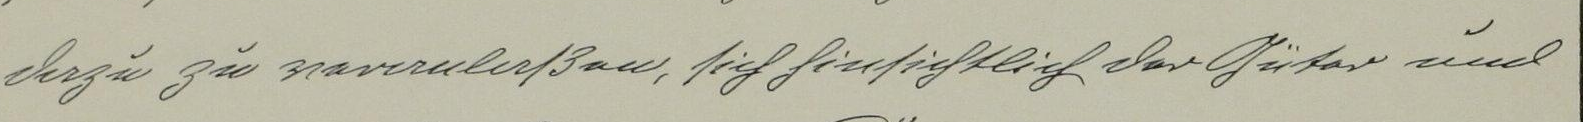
dazu zu veranlaßen, sich hinsichtlich der Güter und
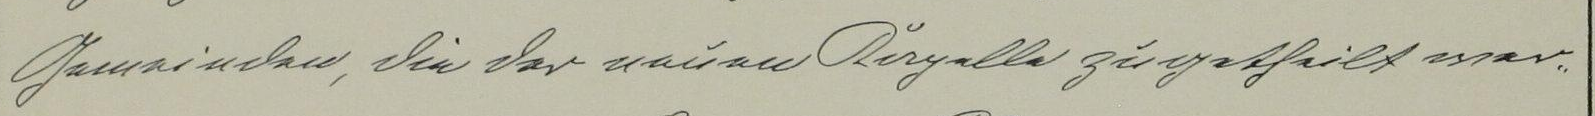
Gemeinden, die der neuen Kapelle zugetheilt wer-
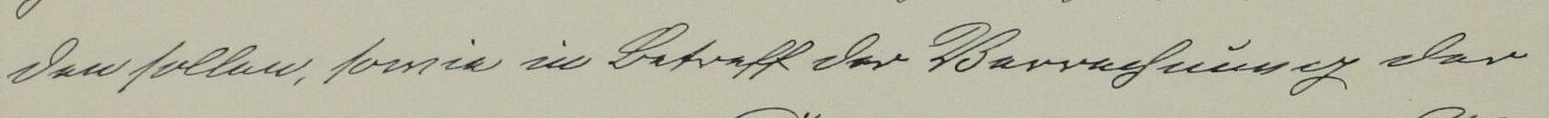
den sollen, sowie in Betreff der Verrechnung der
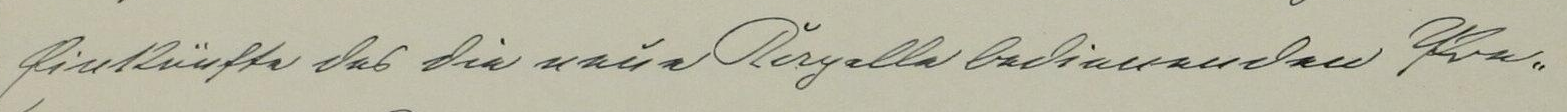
Einkünfte des die neue Kapelle bedienenden Pre-
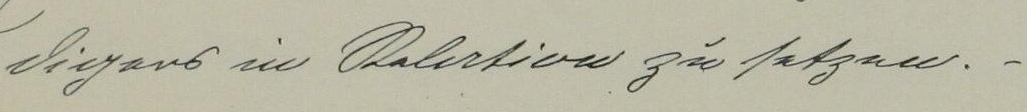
digers in Relation zu setzen.
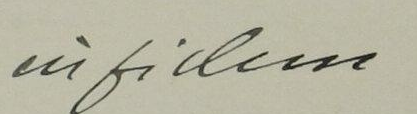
in fidem
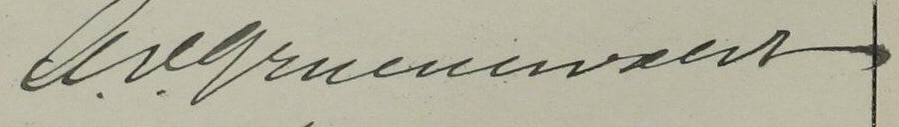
A.v.Gruenewaldt
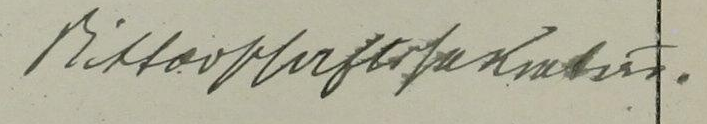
Ritterschaftssekretär
